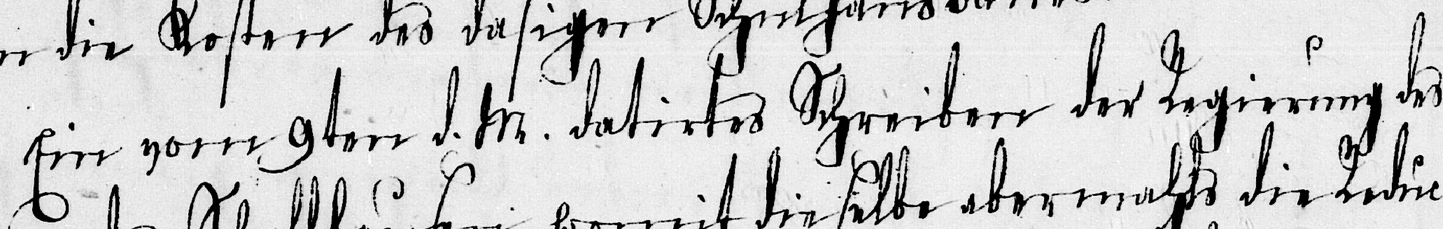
Ein vom 9ten d. M. datirtes Schreiben der Regierung des
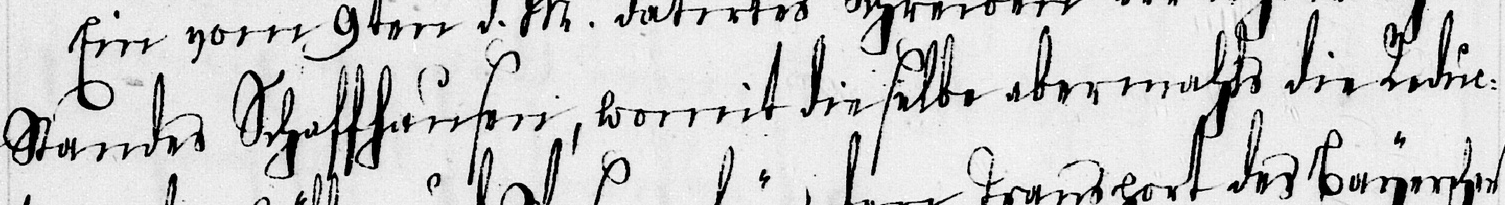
Standes Schaffhausen, womit dieselbe abermahls die Reduc¬
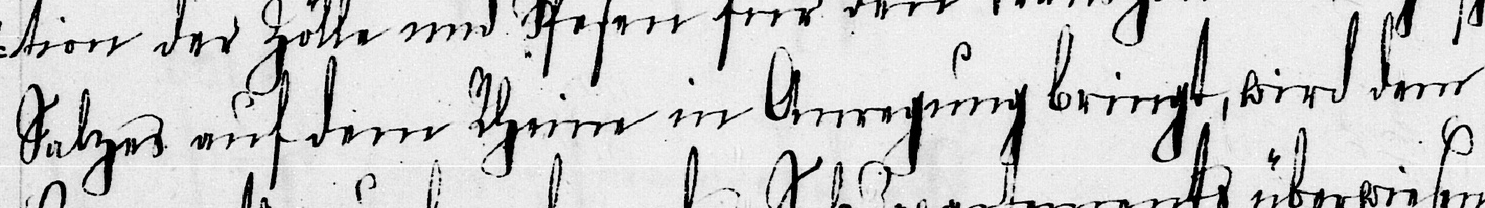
Salzes auf dem Rhein in Anregung bringt, wird dem
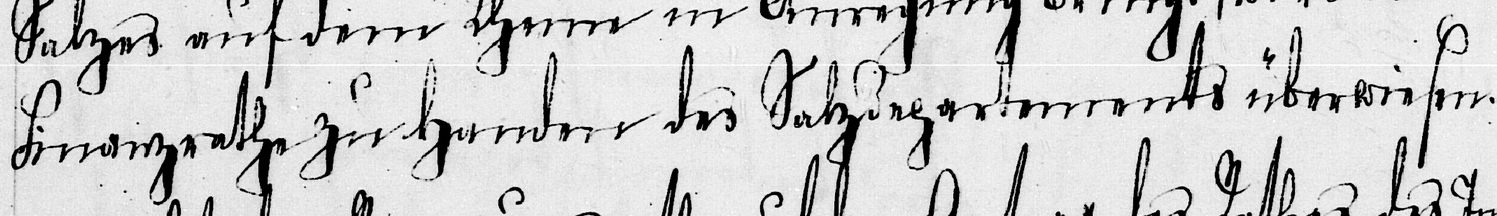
Finanzrathe zu Handen des Salzdepartements überwiesen.
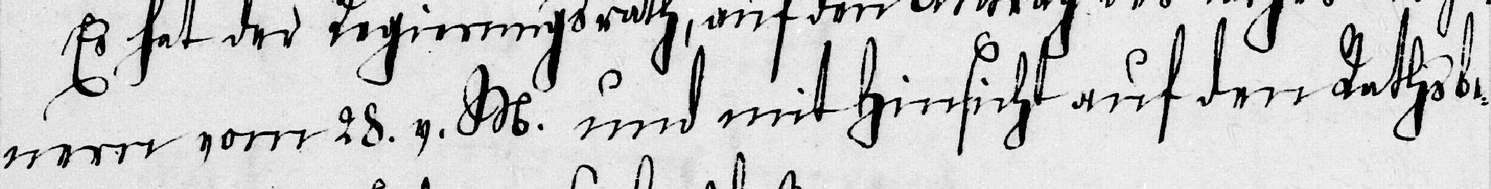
nern vom 28. v. M. und mit Hinsicht auf den Rathsbe¬
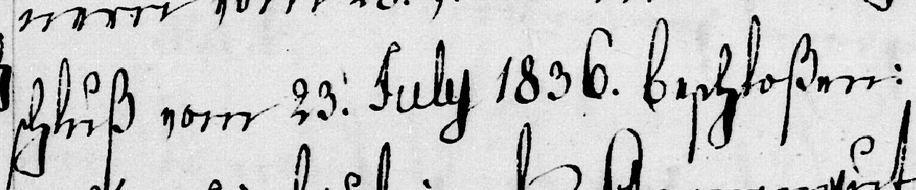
schluß vom 23. July 1836. beschloßen:
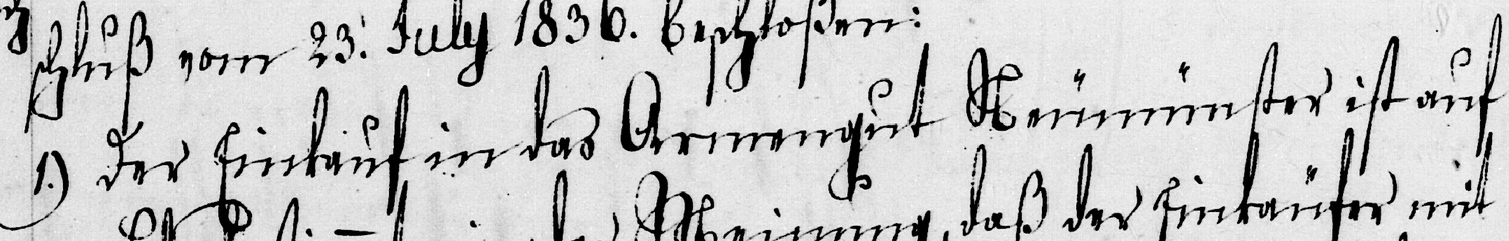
1.) Der Einkauf in das Armengut Neumünster ist auf
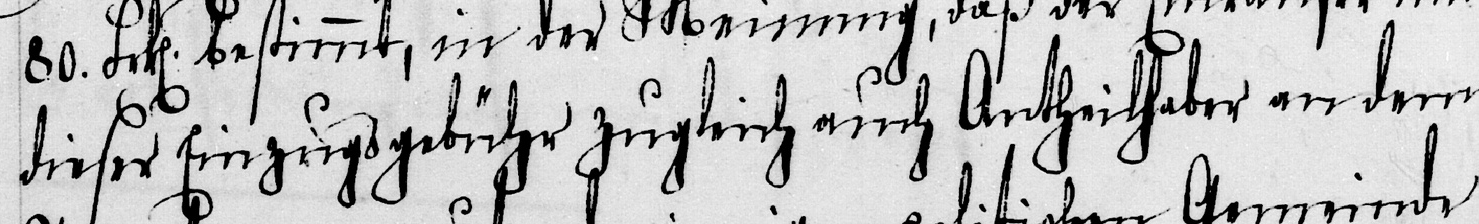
dieser Einzugsgebühr zugleich auch Antheilhaber an dem
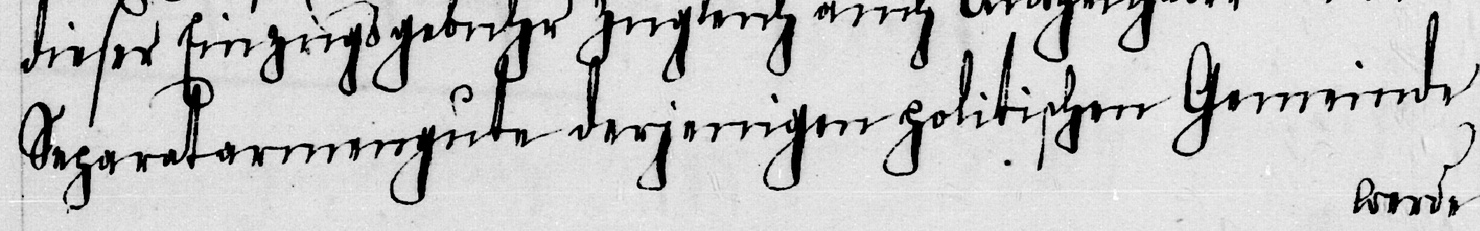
Separatarmengute derjenigen politischen Gemeinde
